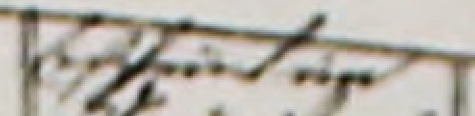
Erscheint im
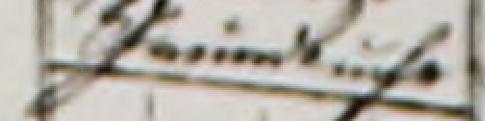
Grundbuche
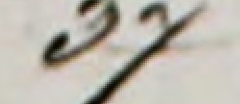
37
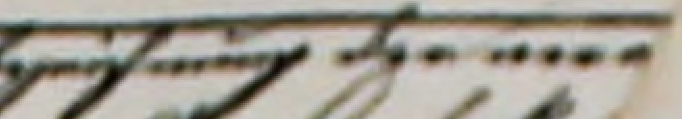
Bezeichnung der aerarischen
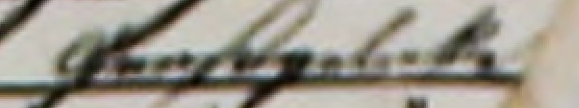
Graßgelake
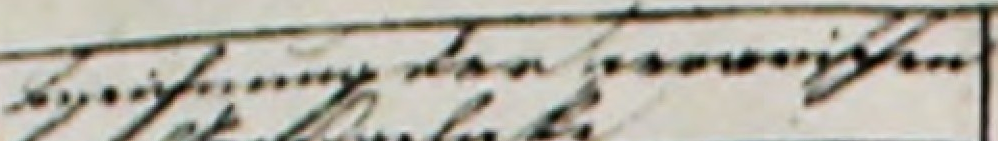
Bezeichnung der aerarischen
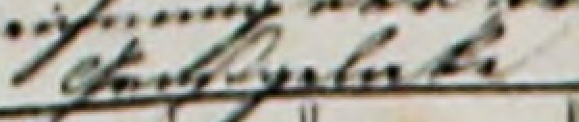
Graßgelake
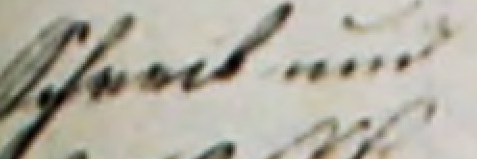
Schreib und
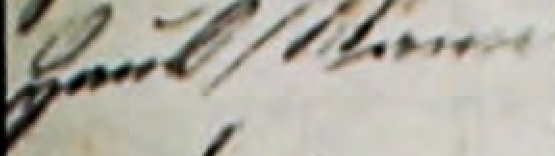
Haus Name
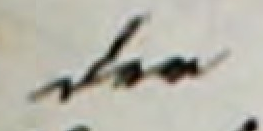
der
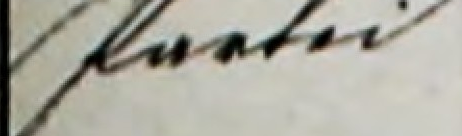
Partei
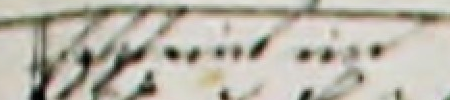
Erscheint im
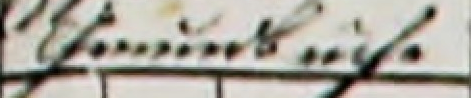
Grundbuche
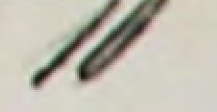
10
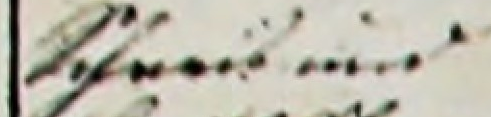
Schreib und
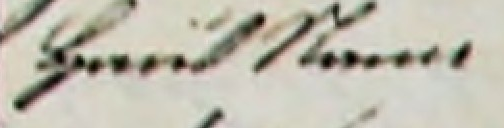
Haus Name
